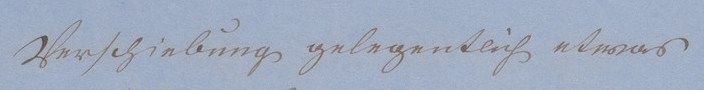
Verschiebung gelegentlich etwas
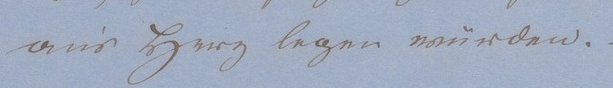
an's Herz legen würden. –
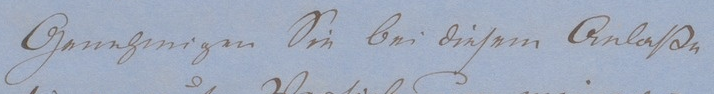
Genehmigen Sie bei diesem Anlaße
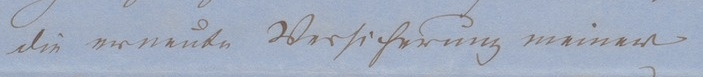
die erneute Versicherung meiner
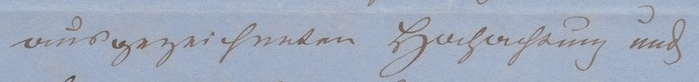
ausgezeichneten Hochachtung und
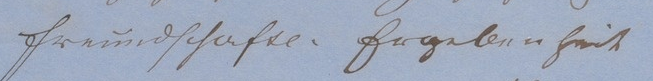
freundschaftl. Ergebenheit
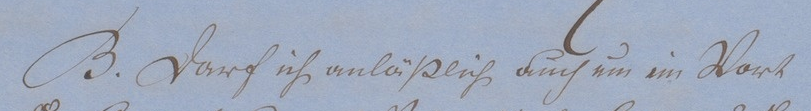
B. Darf ich anläßlich auch um ein Wort
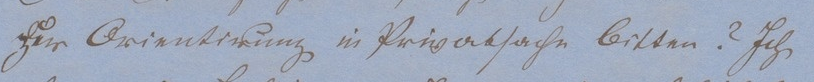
zur Orientirung in Privatsache bitten? Ich
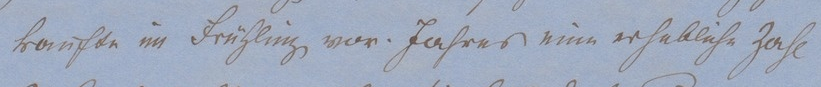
kaufte im Frühling vor. Jahres eine erhebliche Zahl
